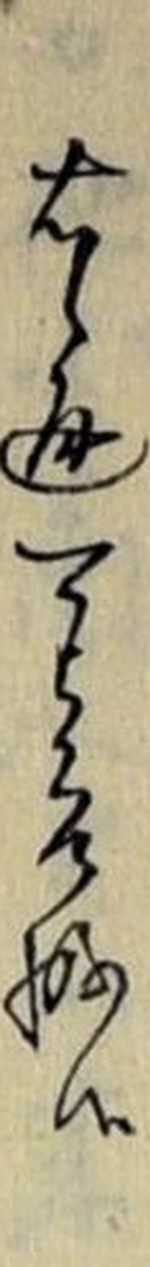右之通可被取扱候
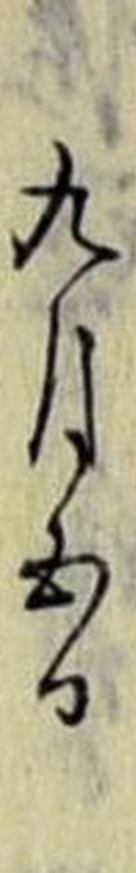九月五日
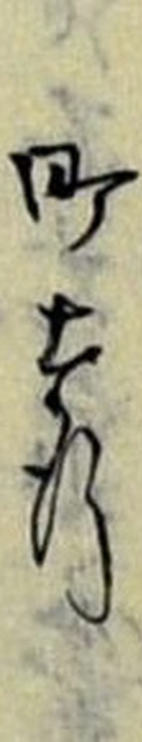御奉行
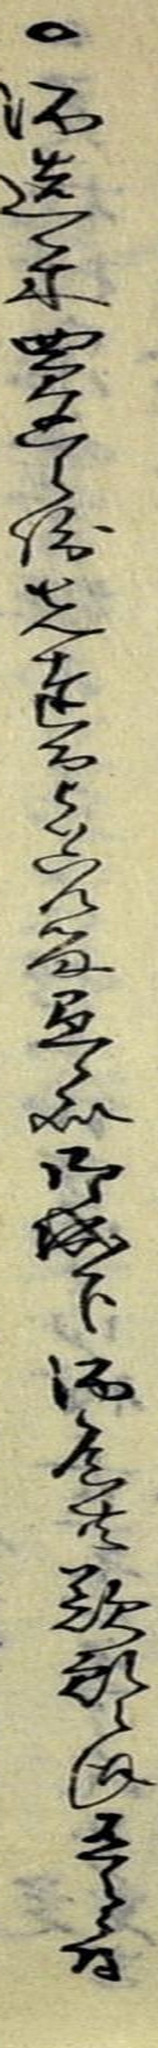○酒造米買込之儀先達而被差留置候処御城下酒屋共歎願之趣有之ニ付
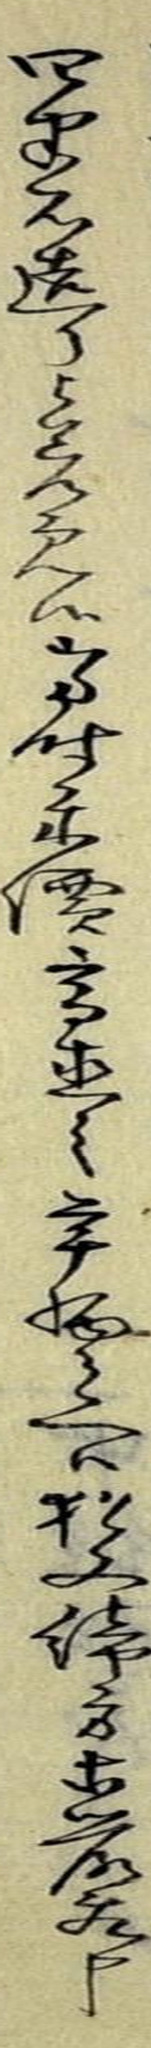四半石造り被差免候当時米価高直之年柄ニ候へハ猶又締方等厳敷申
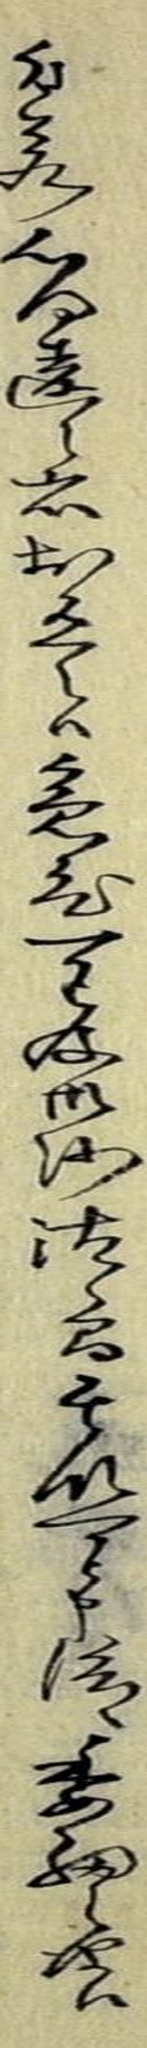付若心得違之者於有之ハ急度可被及御沙汰候間其段可被申渡候委細之儀ハ
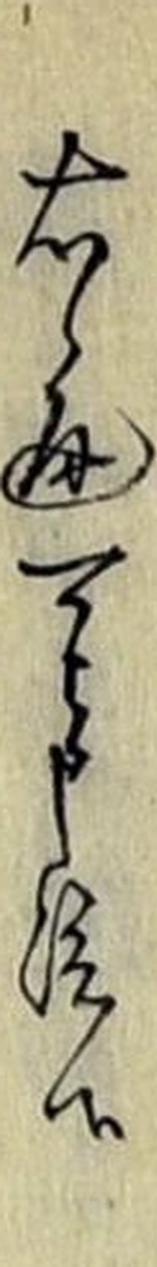右之通可被申渡候
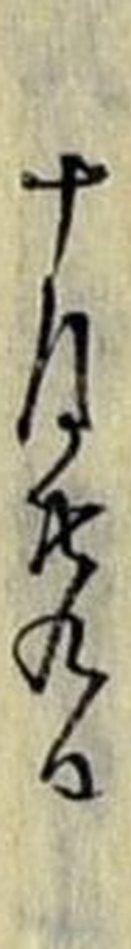十月廿九日
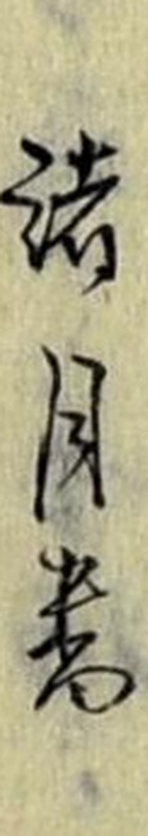諸月番
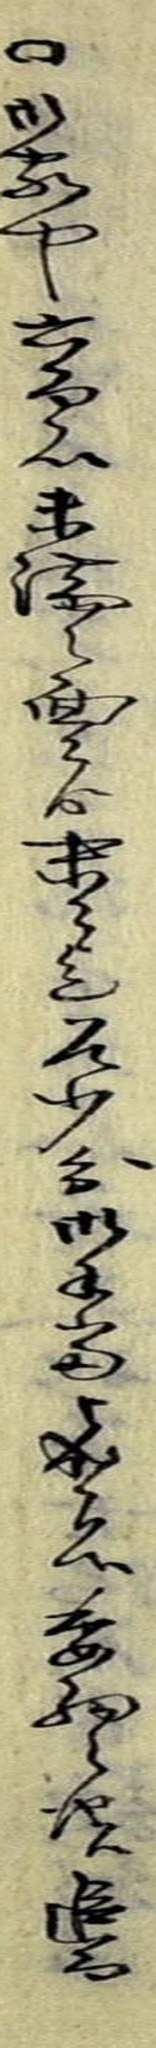○御家中六百石未満之面々ゟ末々迄乍少分御手当被成下候委細之儀ハ追而
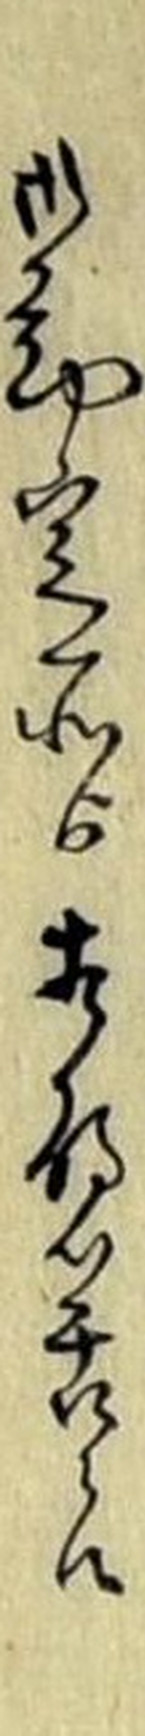御勘定所ゟ相触筈ニ候
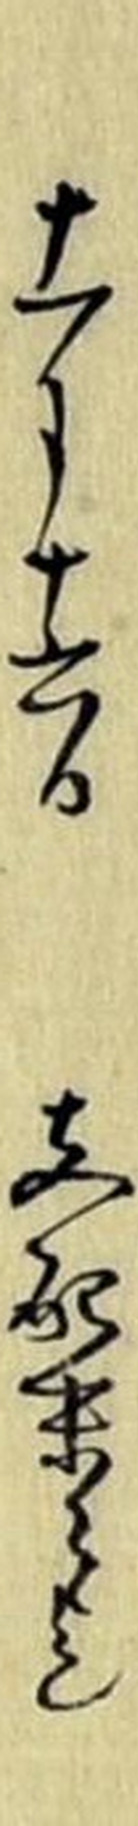十一月十六日支配末々迄

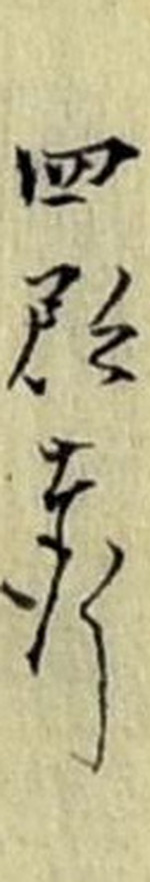四郡奉行
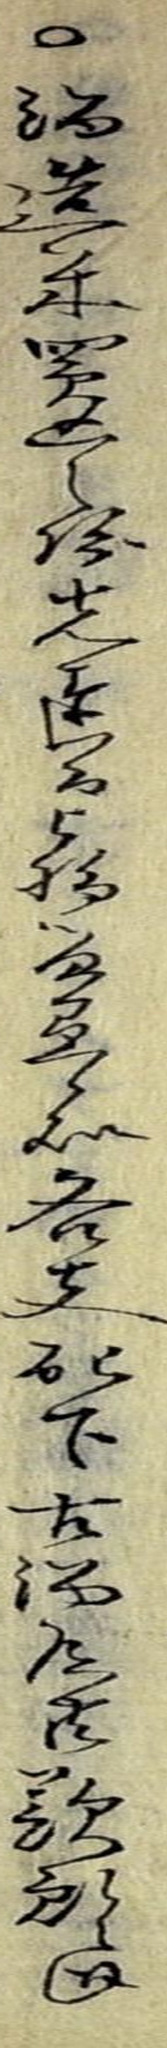○酒造米買込之儀先達而被指留置候処各支配下古酒屋共歎願之趣
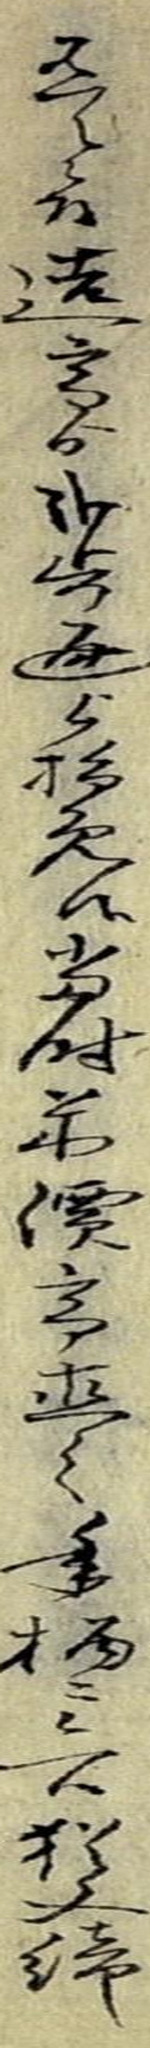有之ニ付造高ゟ弐歩通被指免候当時米価高直之年柄ニ候へハ猶又締
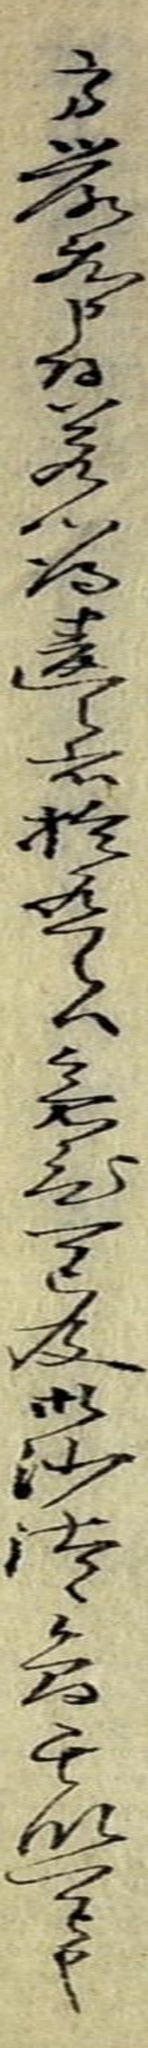方厳敷申付若心得違之者於有之ハ急度可被及御沙汰へ候間其段可被申
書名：命令之部 五
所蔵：福井県文書館 Fukui Prefectural Archives
